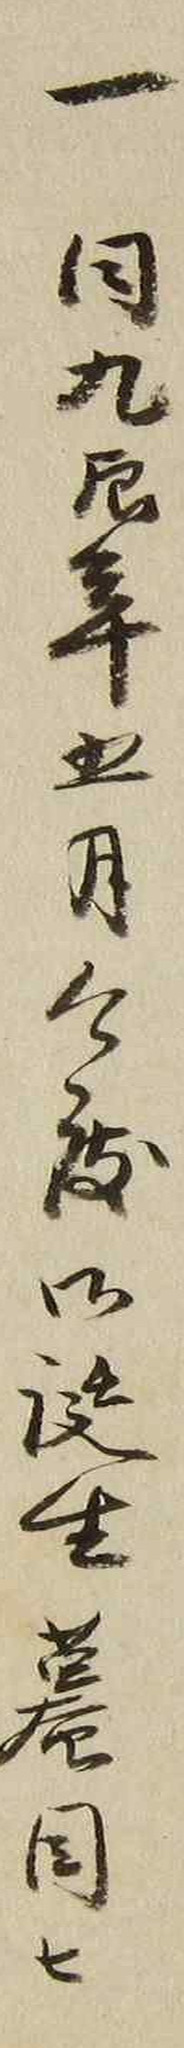一同九辰年五月今度御誕生蟇目被
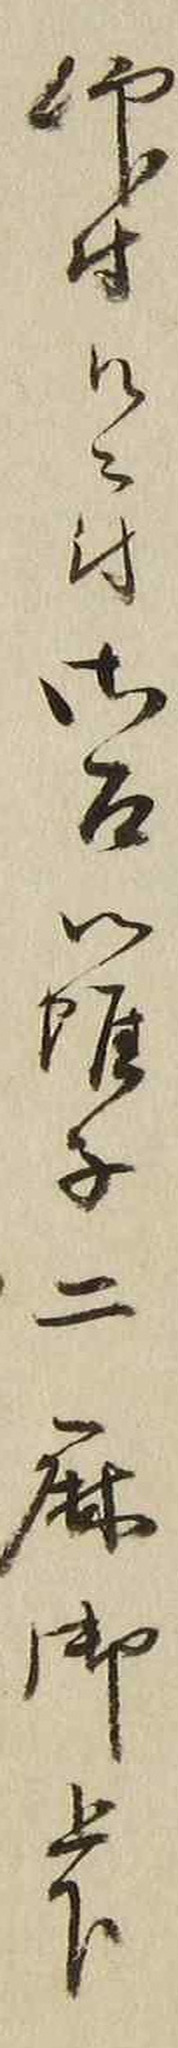仰付候に付御召御帷子二麻上下
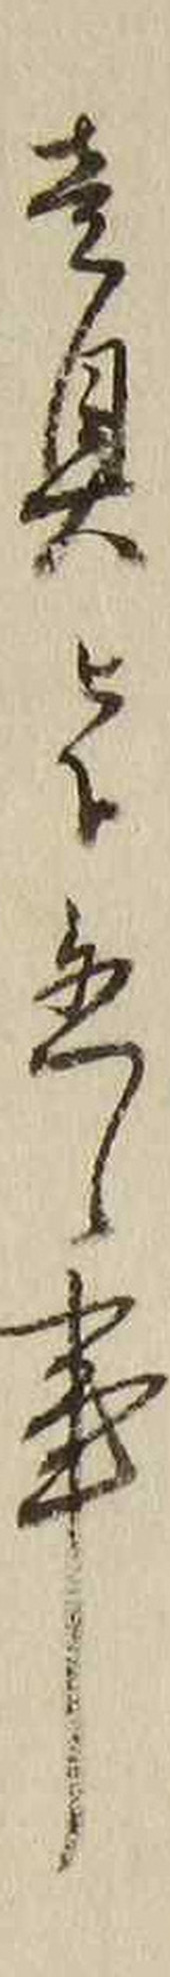壱具被下置候事
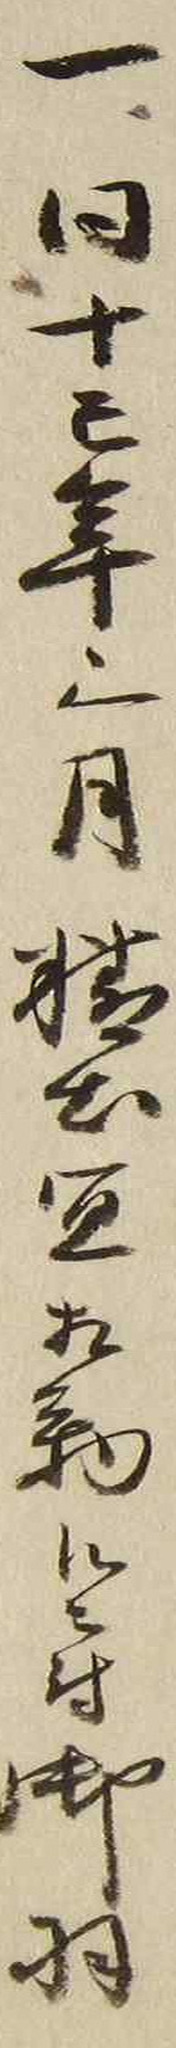一同十巳年三月精出宜相勤候に付御羽
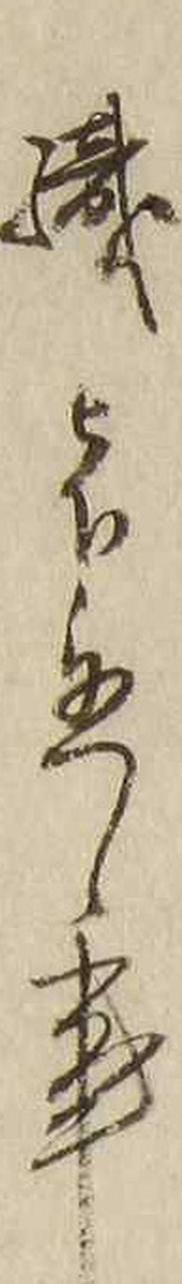織被下置候事

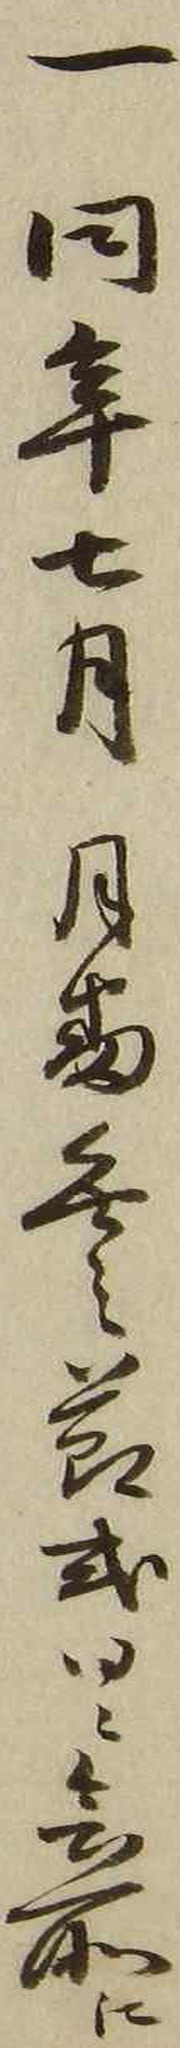一同年七月月番無之節式日に出所江
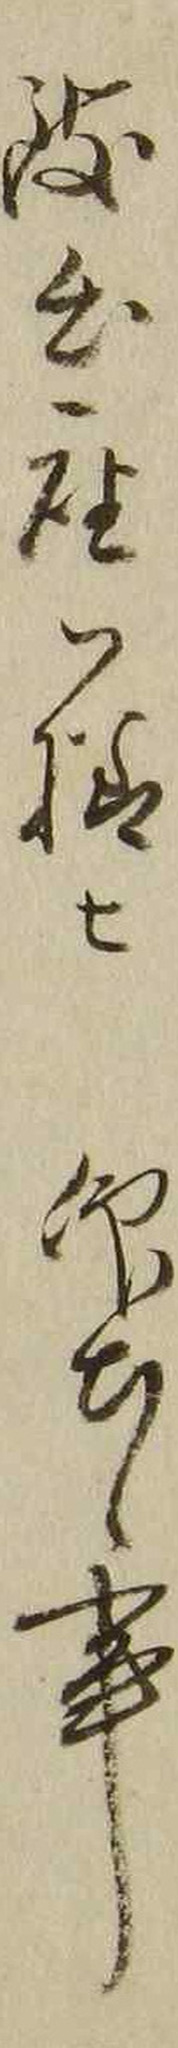致出座候様被仰出候事
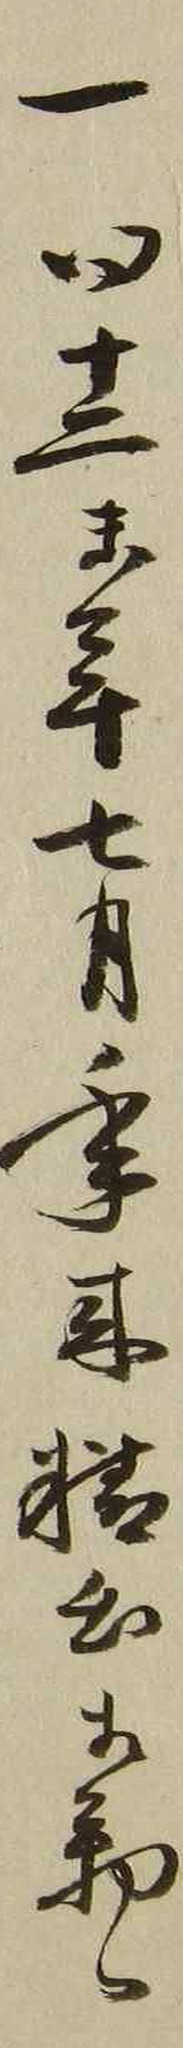一同十二未年七月年来精出相勤候
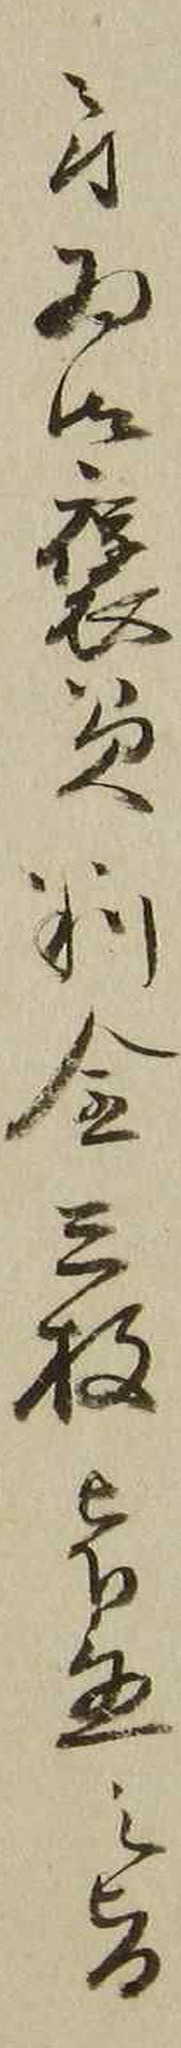に付為御褒美判金三枚被下置候旨
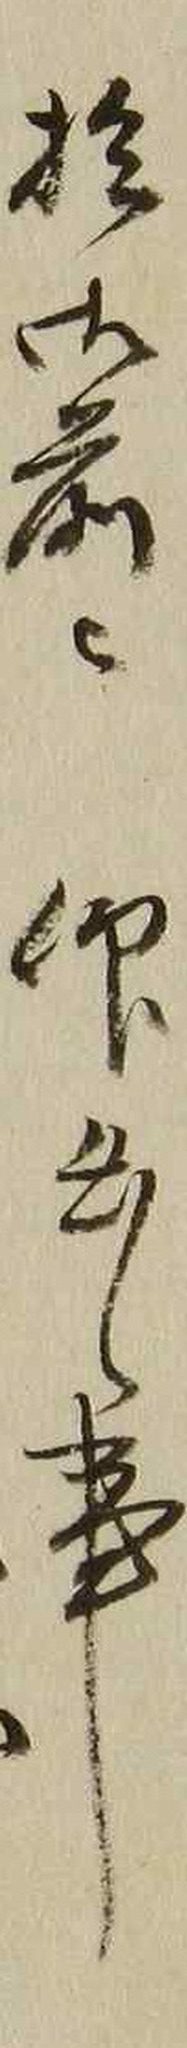於御前被仰出候事
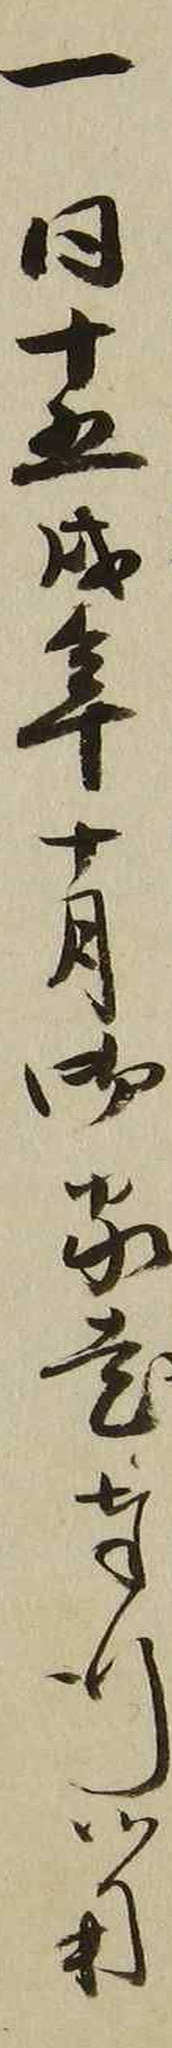一同十五戌年十月御家老奉行御用
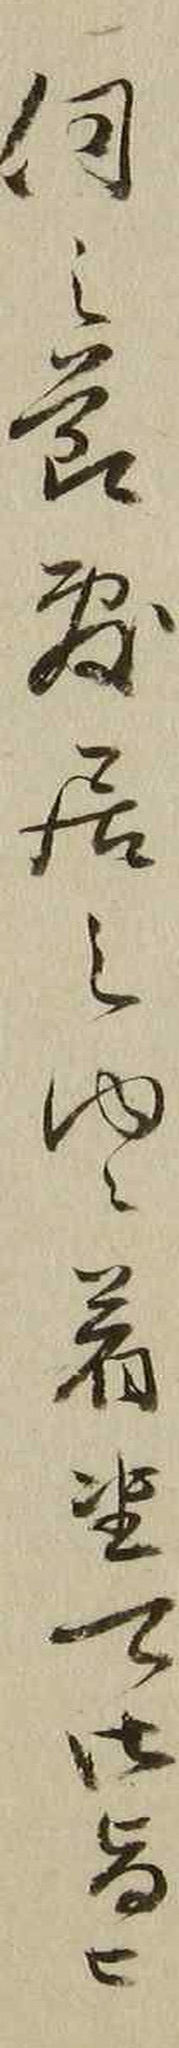伺之節敷居之内へ着座可仕旨被
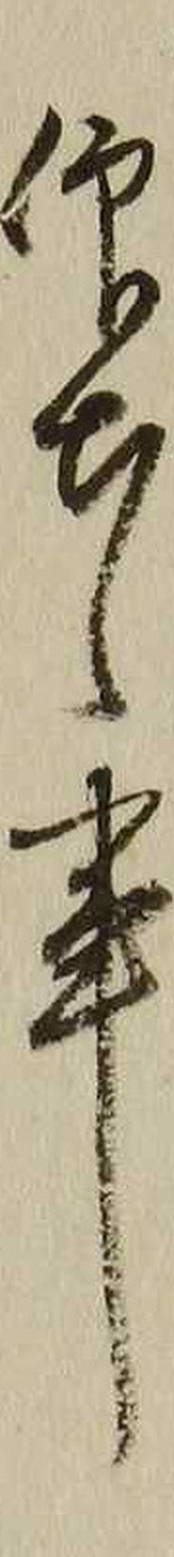仰出候事
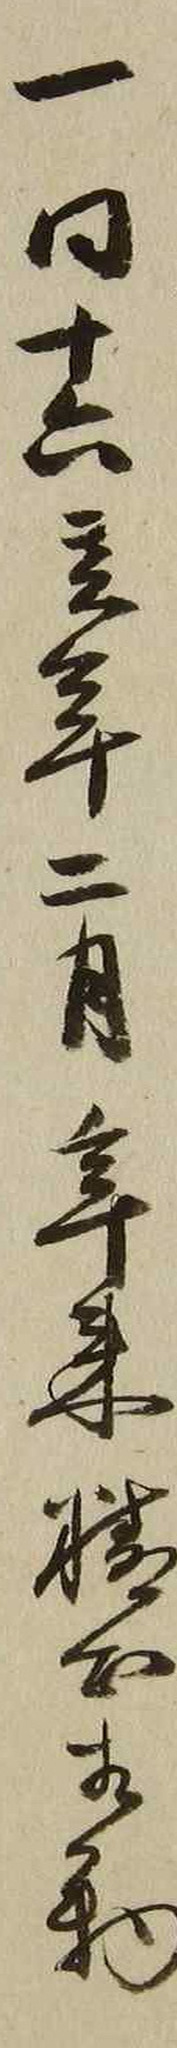一同十六亥年二月年来精出相勤
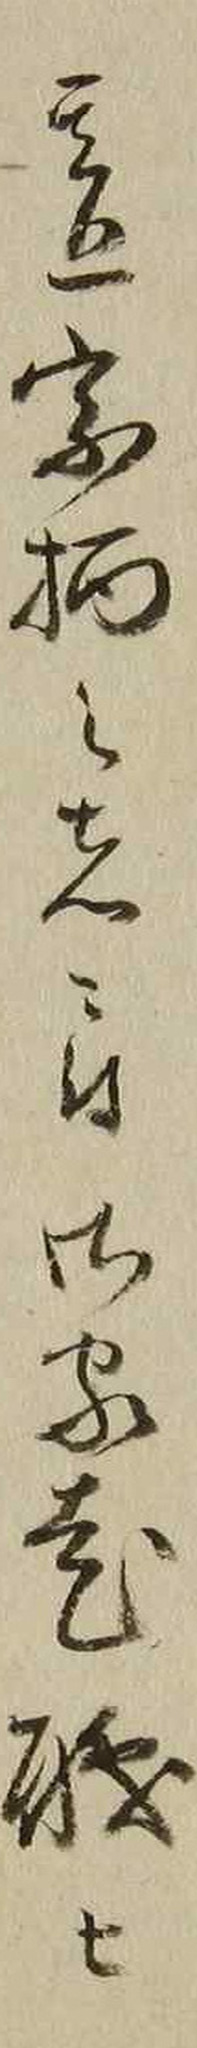其上家柄之者に付御家老職被
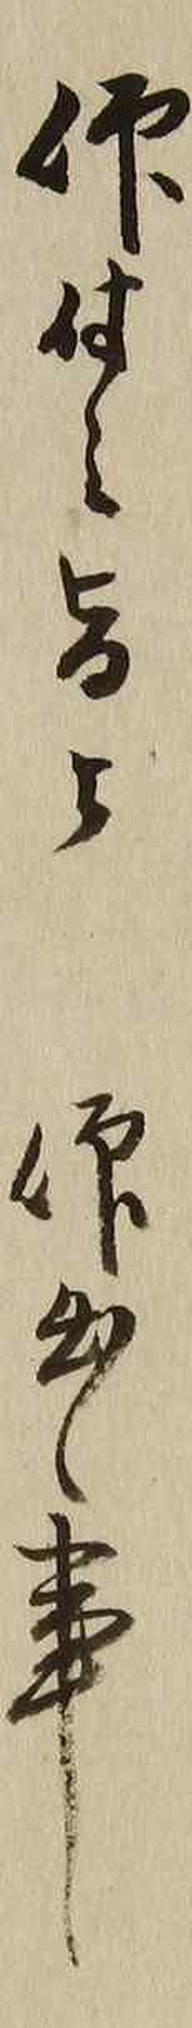仰付候旨被仰出候事
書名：諸士系譜　巻之269　さ之部1
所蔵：会津若松市立会津図書館
